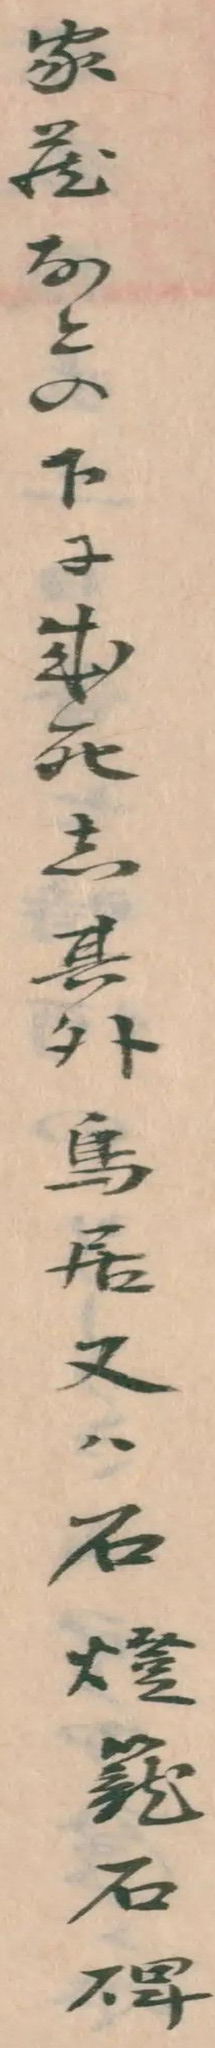家蔵なとの下に成死し其外鳥居又は石灯籠石碑
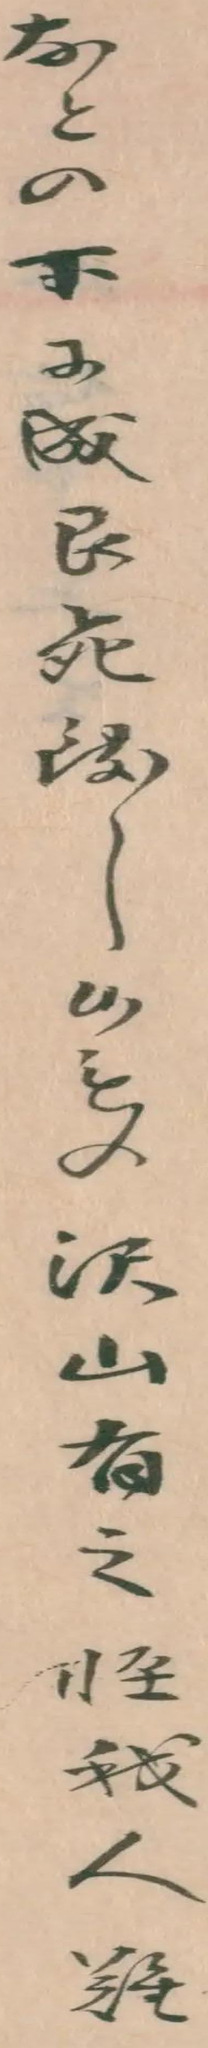なとの下に成即死致し候もの沢山有之怪我人難
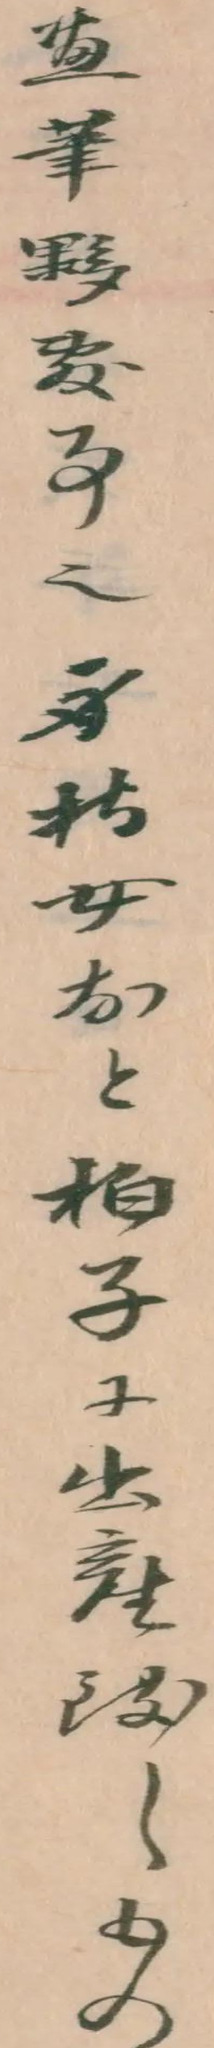尽筆夥敷事也身持女なと拍子に出産致しもの
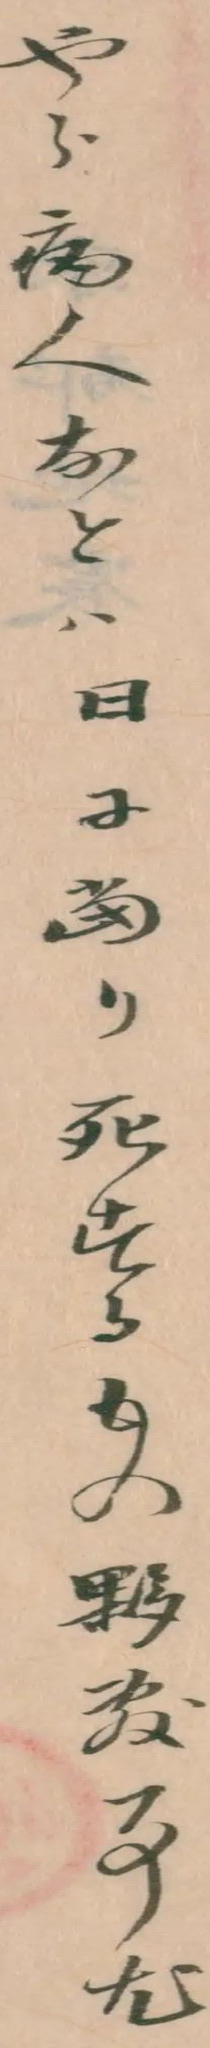やら病人なとは日に當り死するもの夥敷事尤
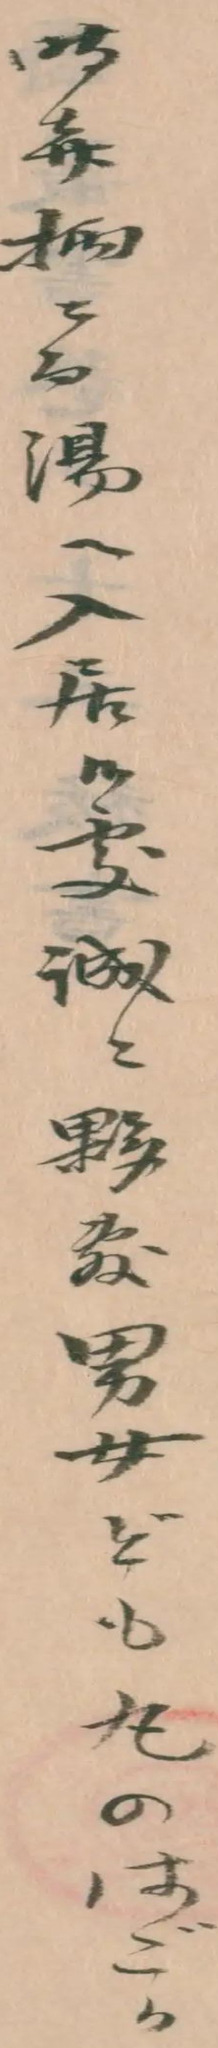時喜柄にて湯へ入居候処誠に夥敷男女ども丸のはだか
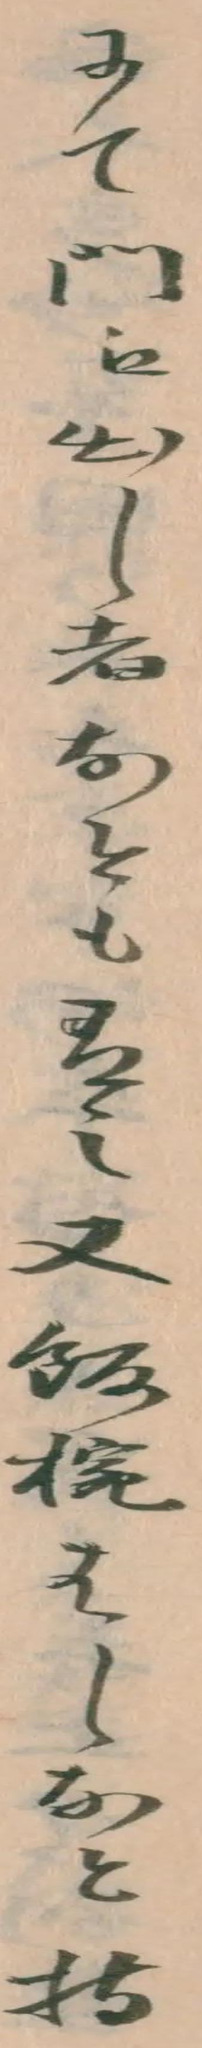にて門江出し者なとも有之又飯椀はしなと持
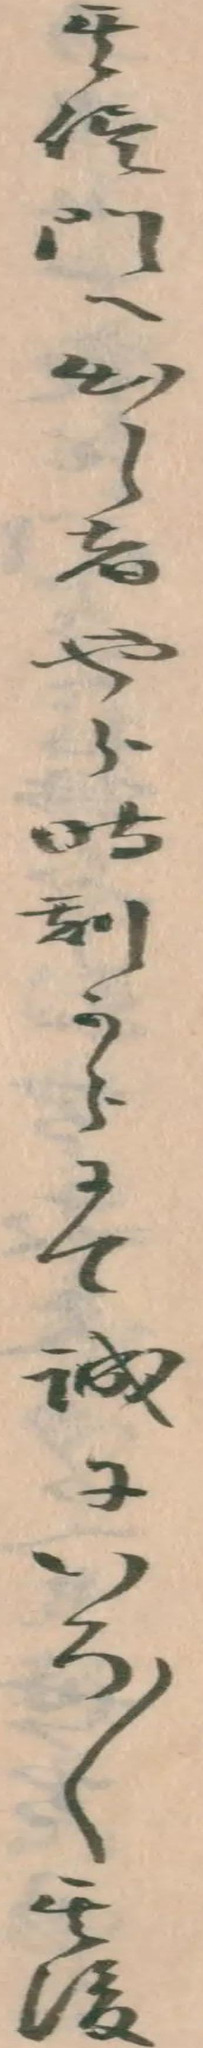其儘門へ出し者やら時刻からにて誠にいろ〳〵其後
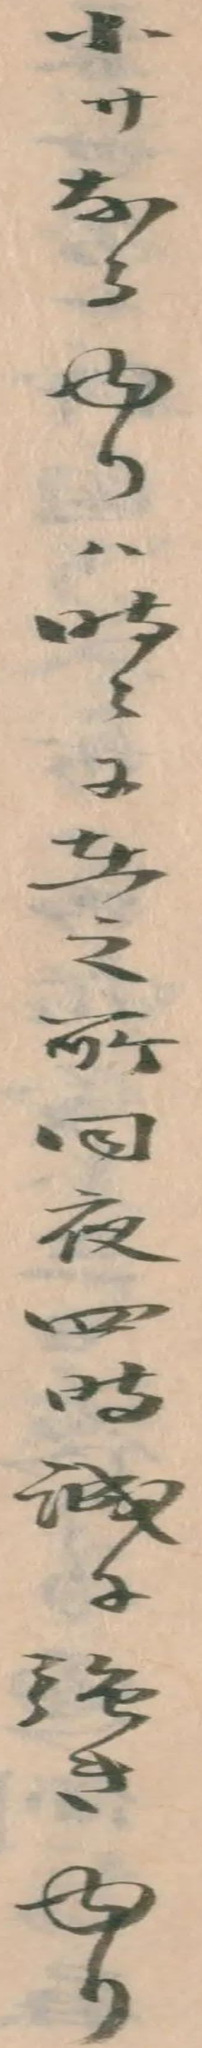小サなるゆりハ時々に在之所同夜四時誠に強きゆり
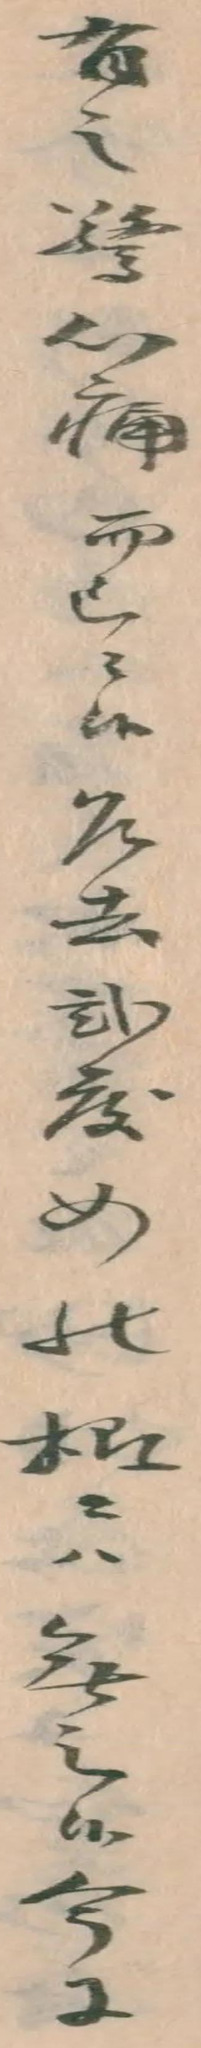有之驚心痛而己二候乍去弐度メの様二は無之候今に
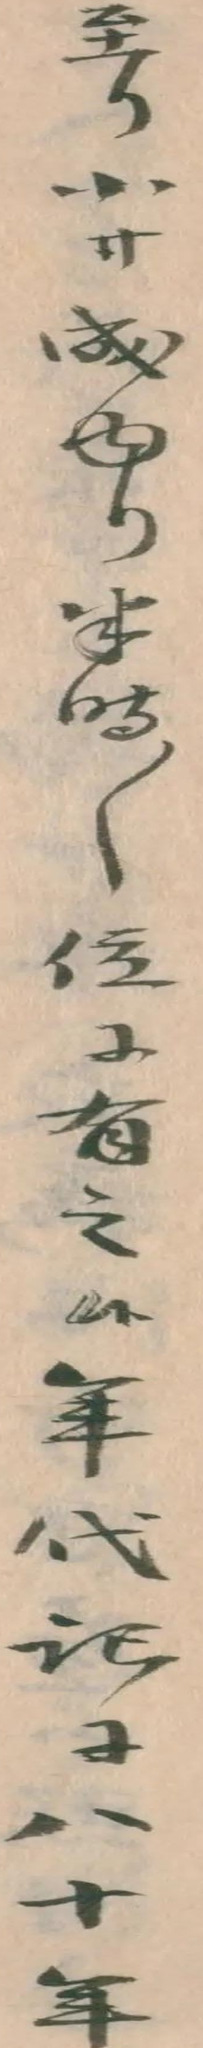至り小サ成ゆり半時〳〵位に有之候年代記に八十年
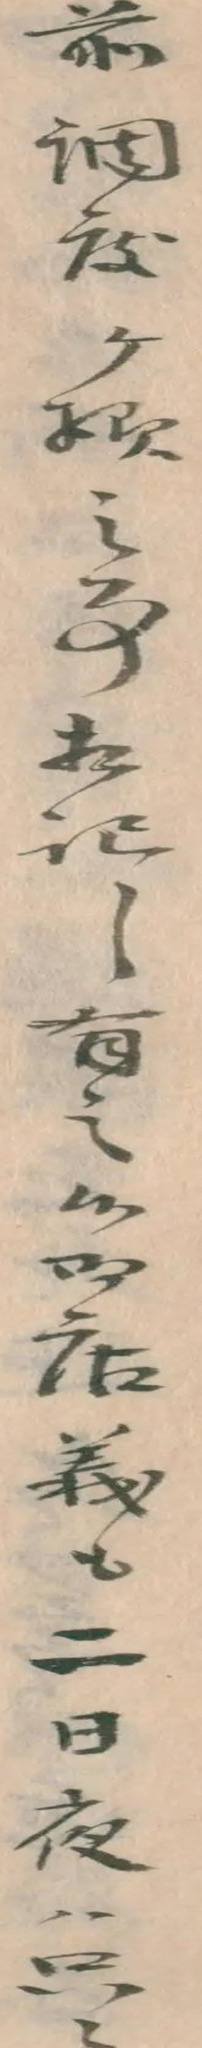前調度ヶ様之事相記し有之候御店義も二日夜ハ只々
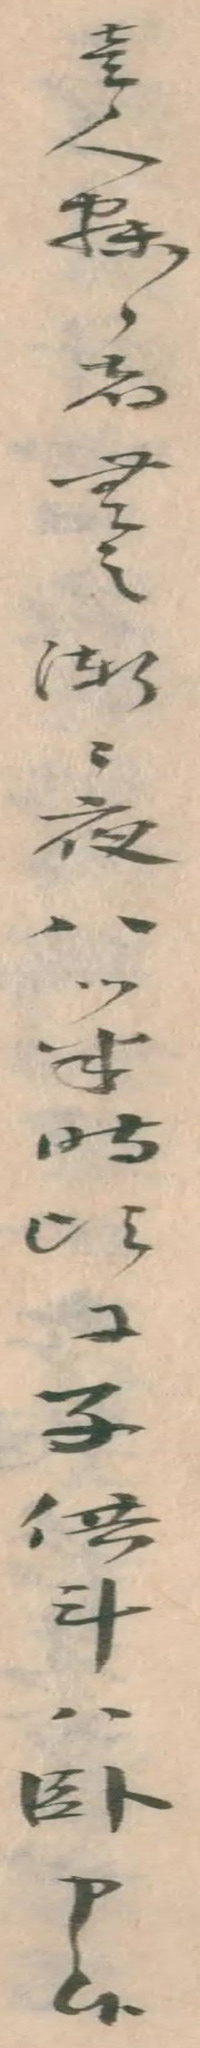壱人寝候者無之漸々夜八ッ半時頃に子供斗ハ臥申候
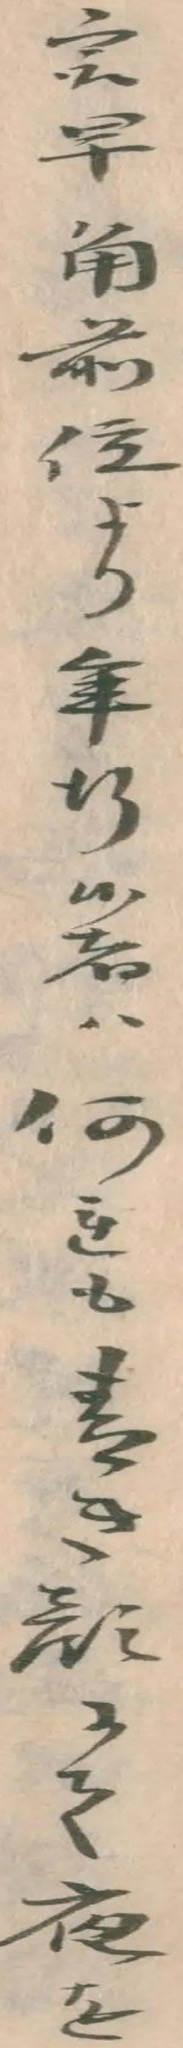最早角前位より年行候者ハ何れも青き顔にて夜を
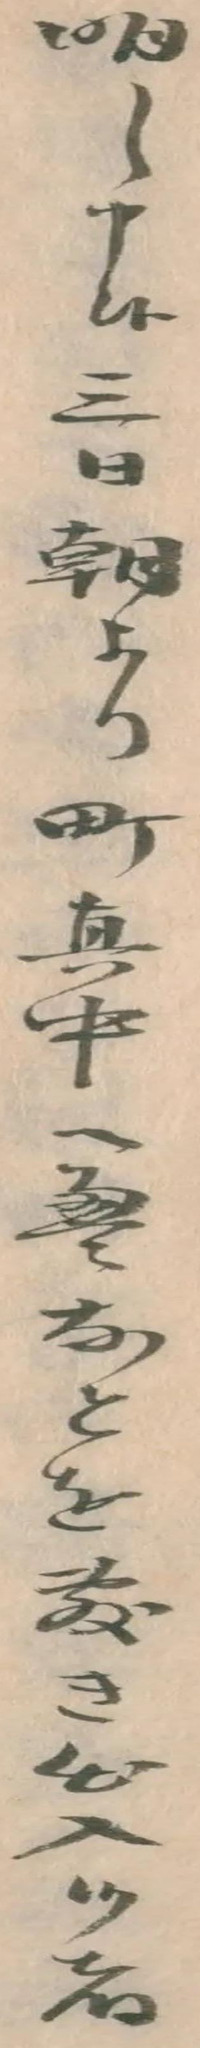明し申候三日朝より町真中へ畳なとを敷き出入候者
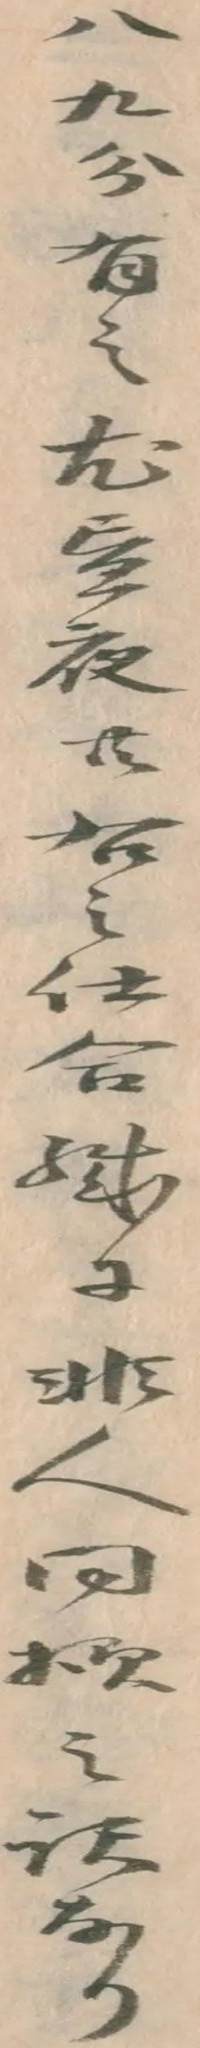八九文有之之尤昼夜共右之仕合誠に非人同様之訳なり

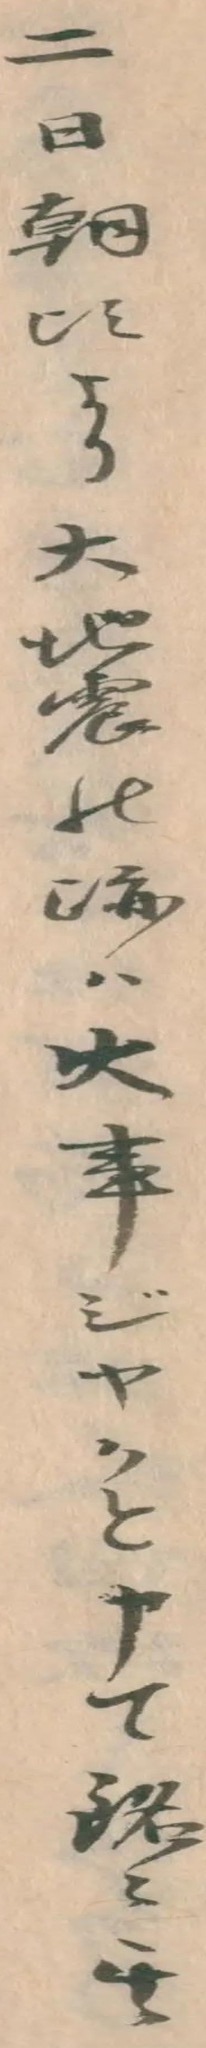二日朝比より大地震の跡ハ火事ジヤ〃と申て銘々其
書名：京都地震
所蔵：国立国会図書館 National Diet Library, JAPAN
